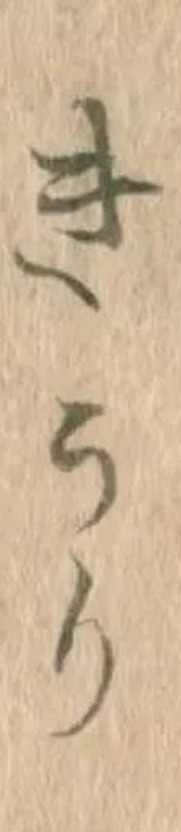きうり
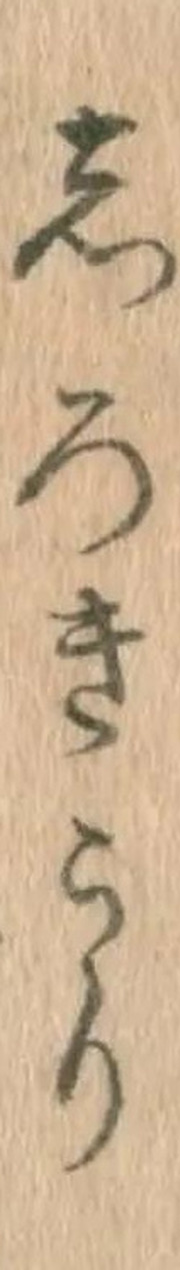しろきうり
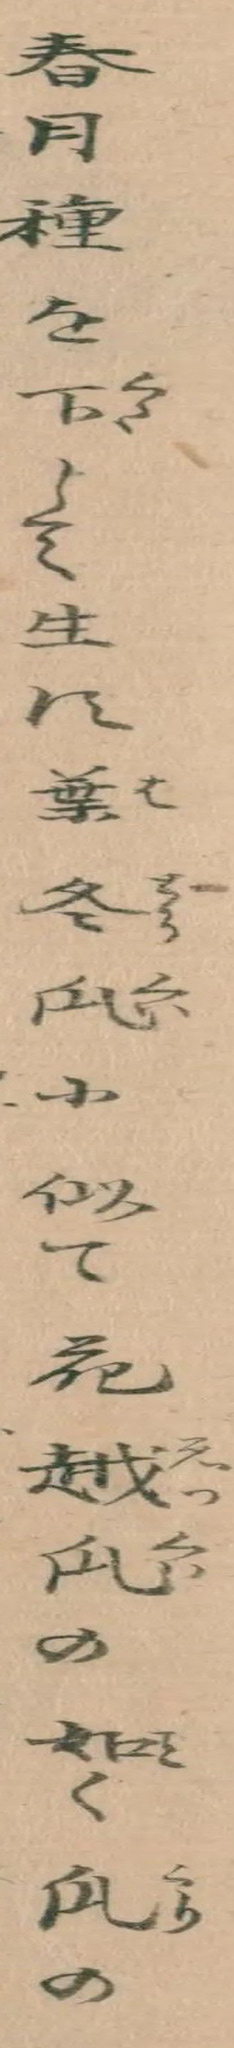春月種を下して生す葉冬瓜に似て花越瓜の如く瓜の
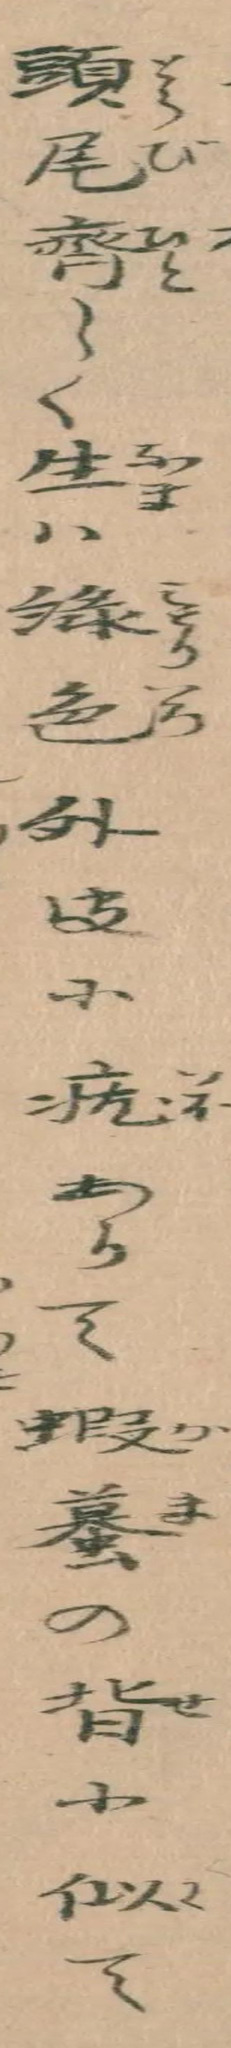頭尾斉しく生は緑色外皮に疣ありて蝦蟇の背に似て
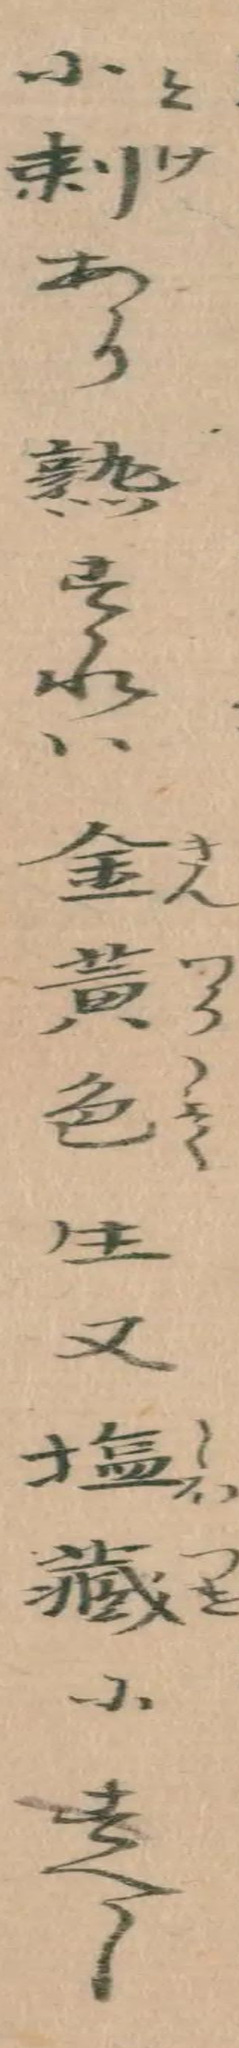小剌あり熟すれは金黄色生又塩蔵にすへし
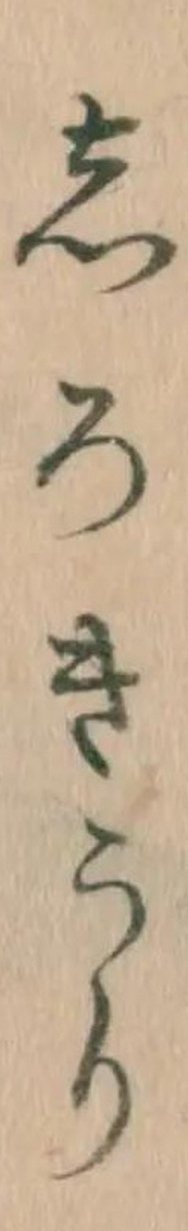しろきうり
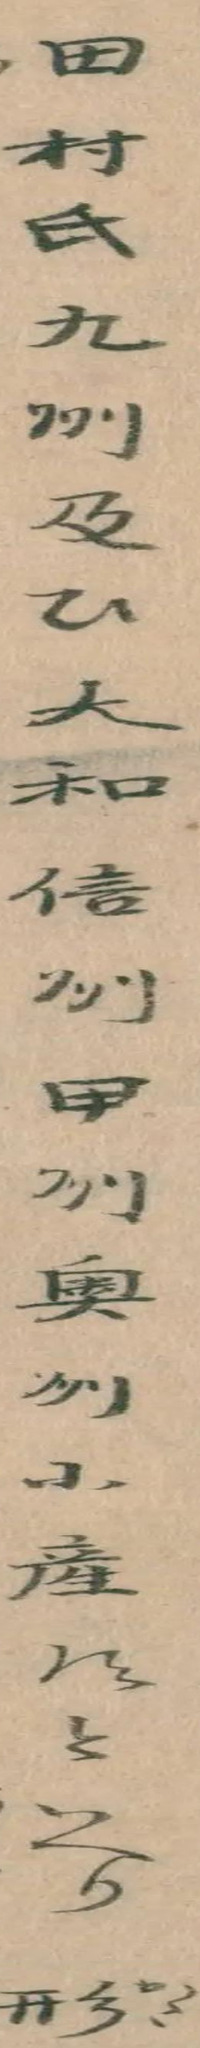田村氏九州及ひ大和信州甲州奥州に産すといへり形
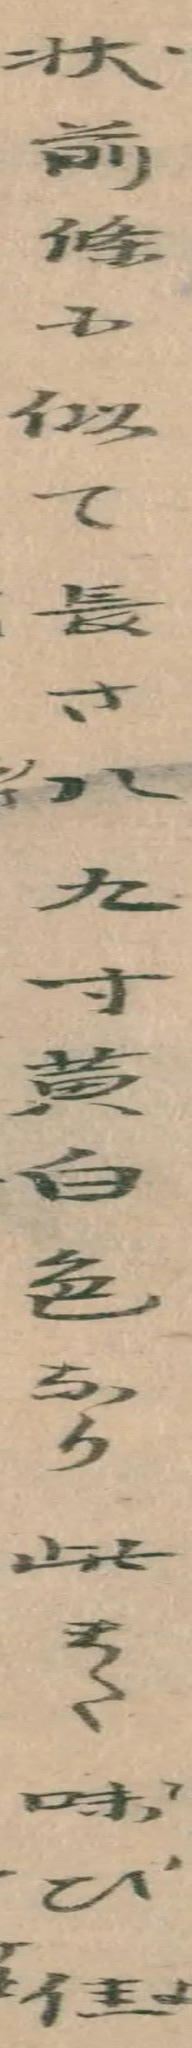状前条に似て長さ八九寸黄白色なり此また味ひ佳
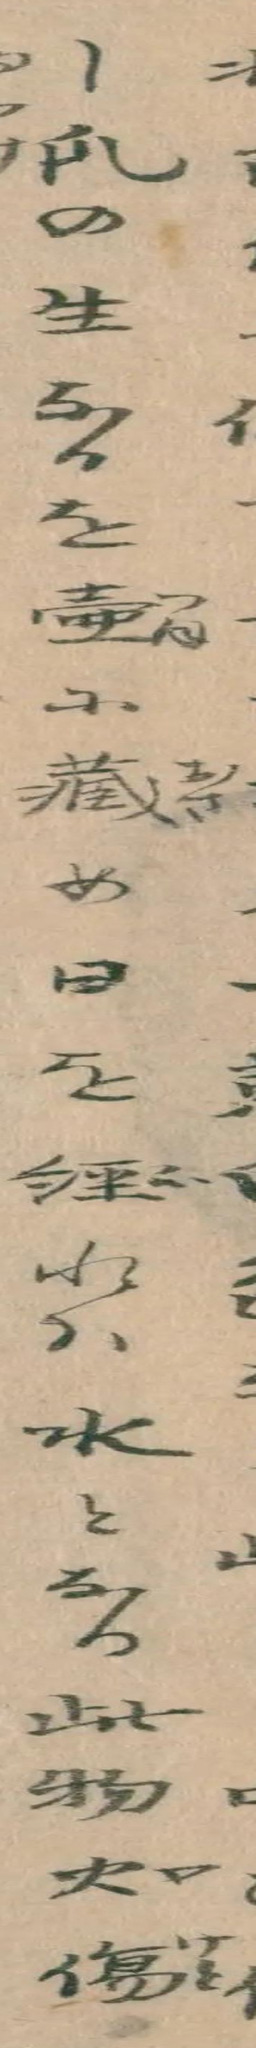し瓜の生なるを壺に蔵め日を経れは水となる此物火傷
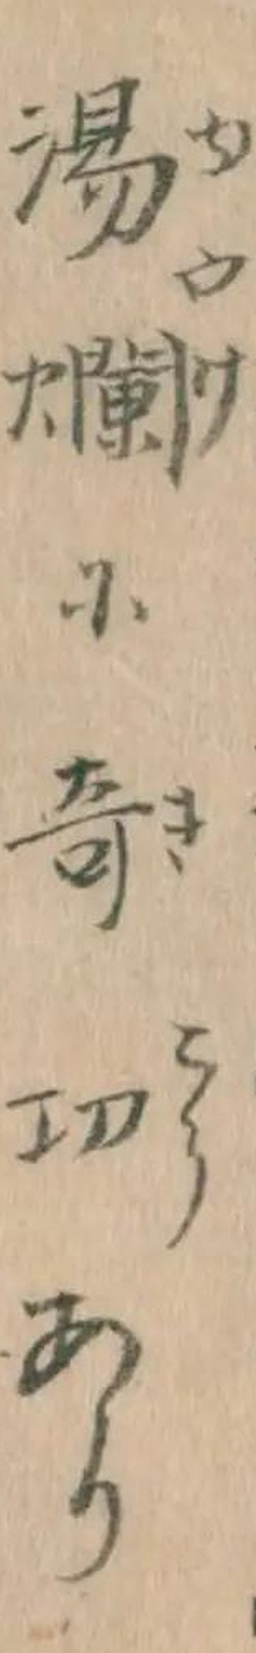湯爛に奇功あり

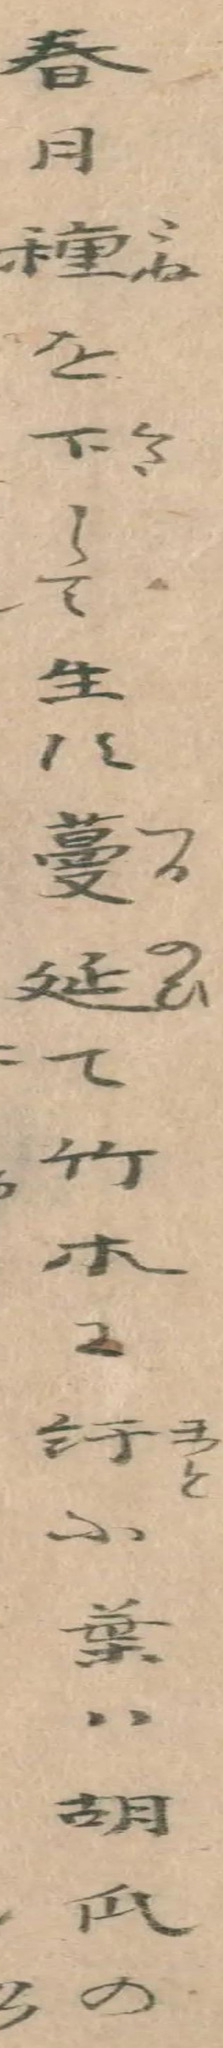春月種を下して生す蔓延て竹木に紆ふ葉は胡瓜の
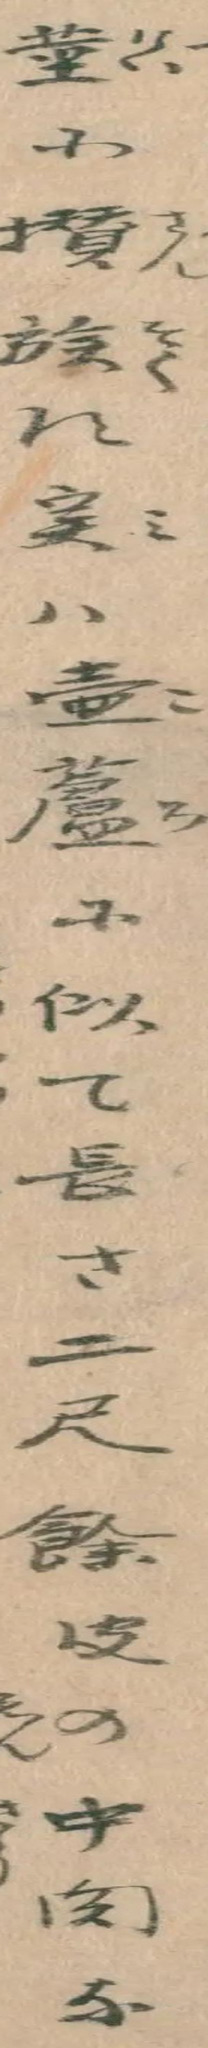茎に攢族す実は壺芦に似て長さ二尺余皮の中肉な
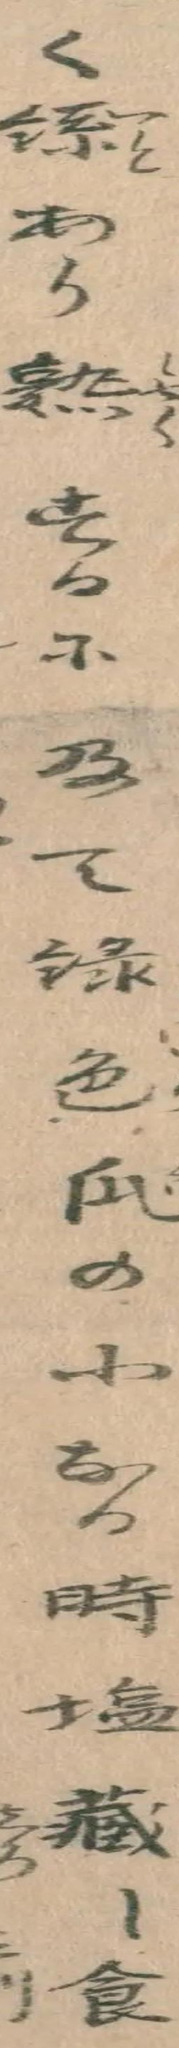く糸あり熟するに及て緑色瓜の小なる時塩蔵し食
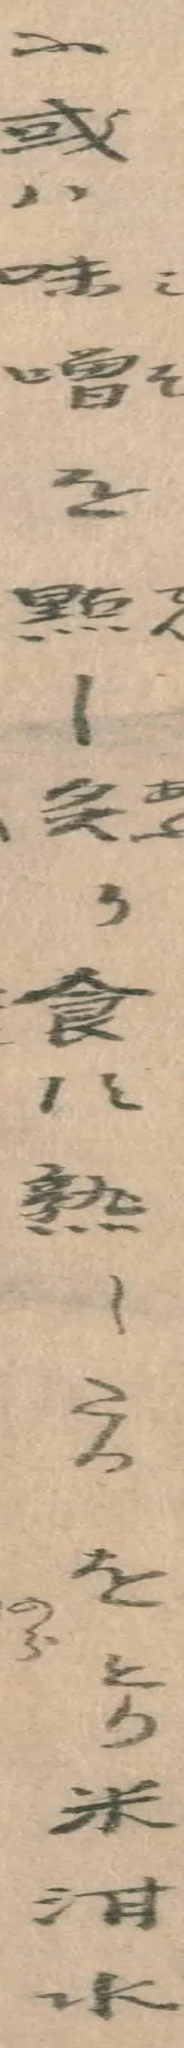ふ或は味噌を点し炙り食す熟したるをとり米泔水
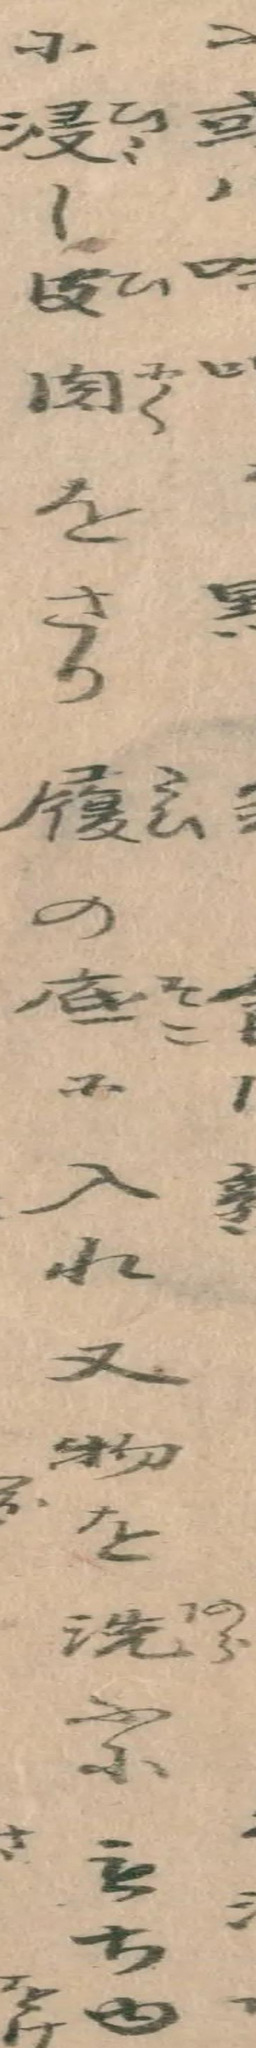に浸し皮肉をさり履の底に入れ又物を洗ふにもちゆ
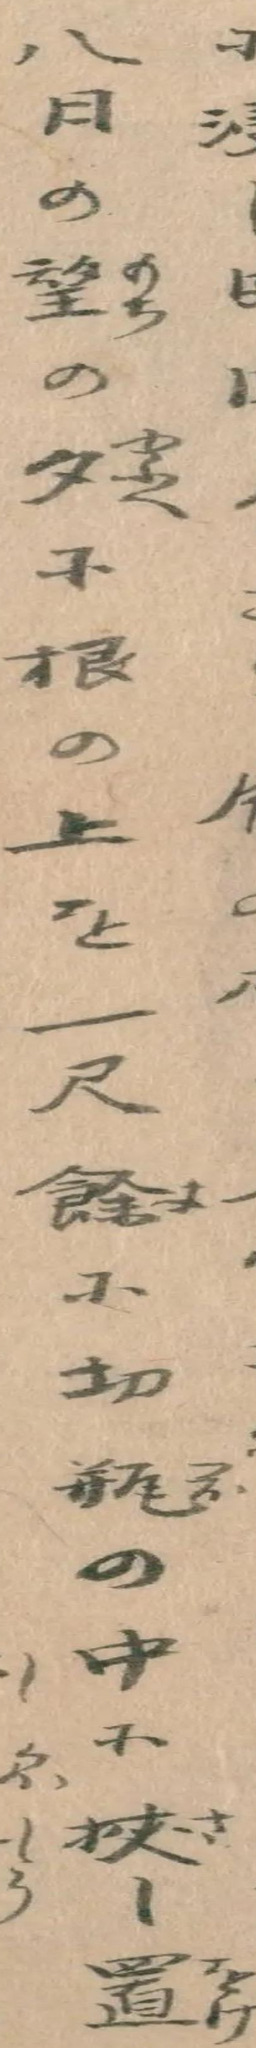八月の望の夕に根の上を一尺余に切瓶の中に挟し置
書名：本草図譜. 巻52-54
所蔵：国立国会図書館 National Diet Library, JAPAN
